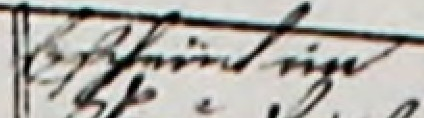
Esseint im
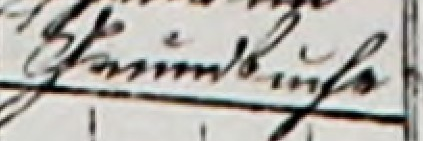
Grundbuche
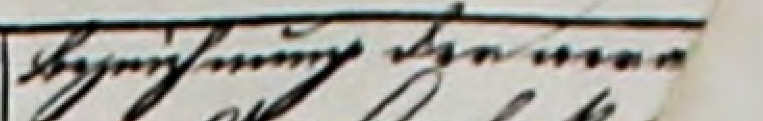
Bezeichnung der erarischen
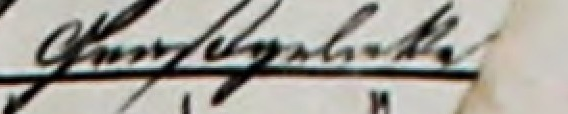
Graßgelake
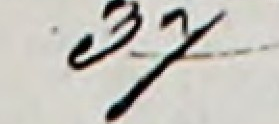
37
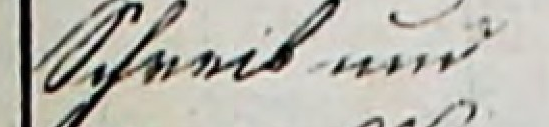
Schreib und
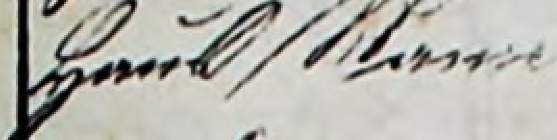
Haus Name
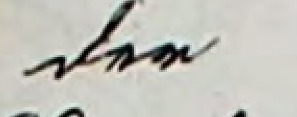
der
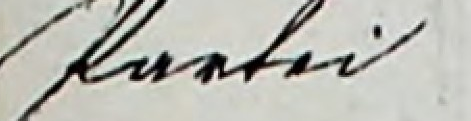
Partei.
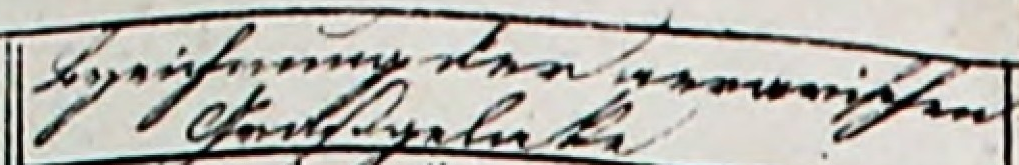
Bezeichnung der erarischen
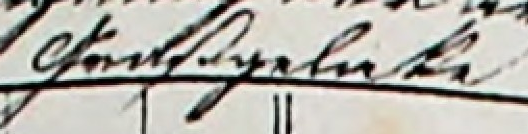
Graßgelake
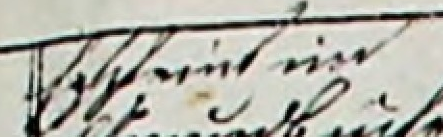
Esseint im
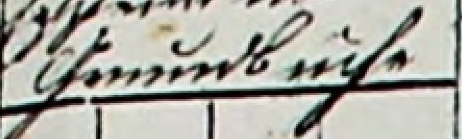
Grundbuche
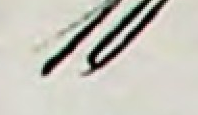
10
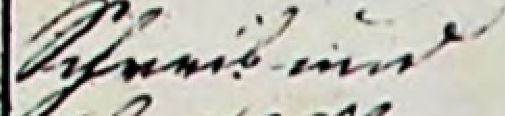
Schreib und
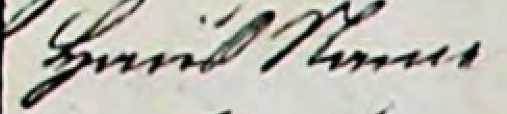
Haus Name
